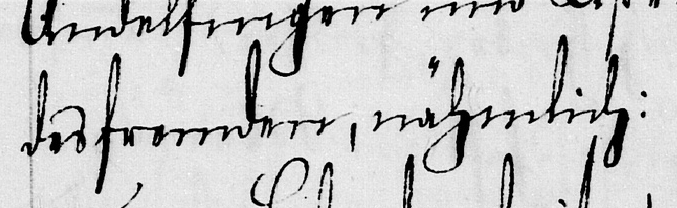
desfremden, nähmlich:
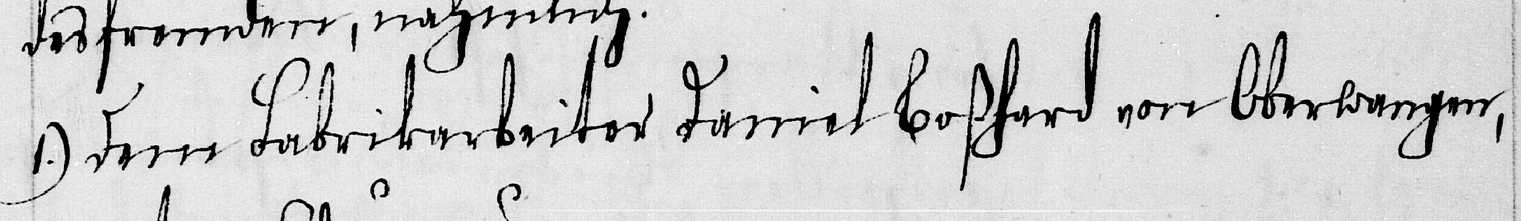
1.) Dem Fabrikarbeiter Daniel Boßhard von Oberwangen,
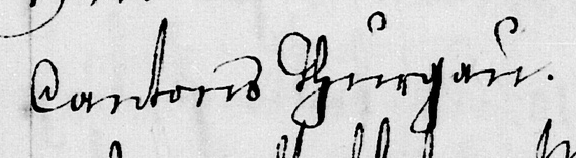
Cantons Thurgau.
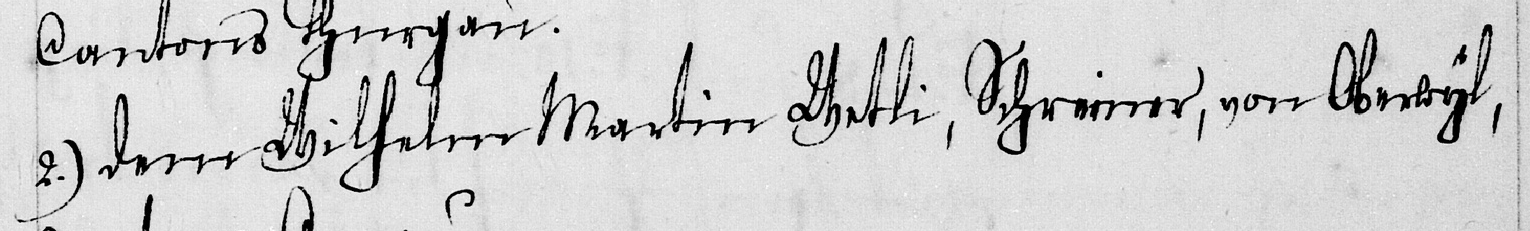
2.) dem Wilhelm Martin Wetli, Schreiner, von Oberwyl,
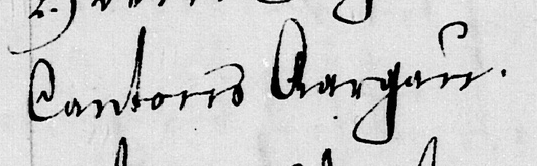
Cantons Aargau.
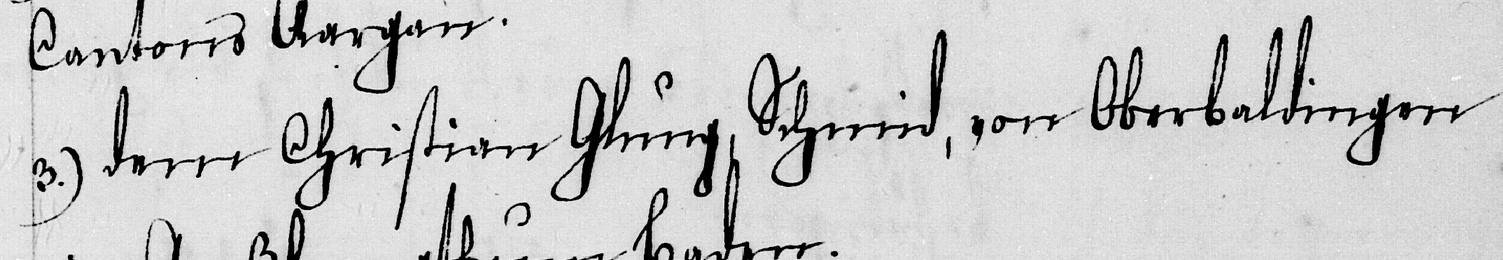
3.) dem Christian Glung, Schmid, von Oberbaldingen
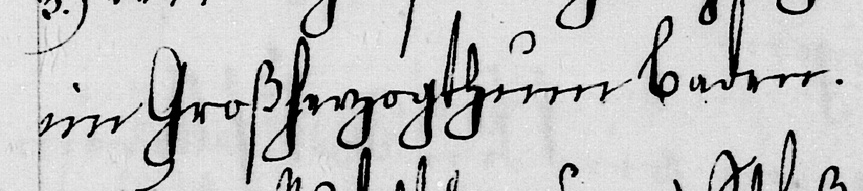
im Großherzogthum Baden.
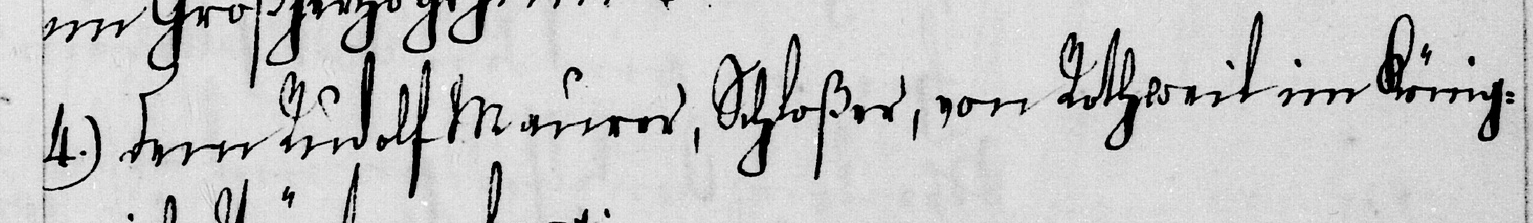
4.) Dem Rudolf Maurer, Schloßer, von Rothwil im König¬
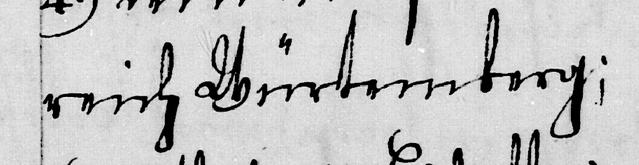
reich Würtemberg;
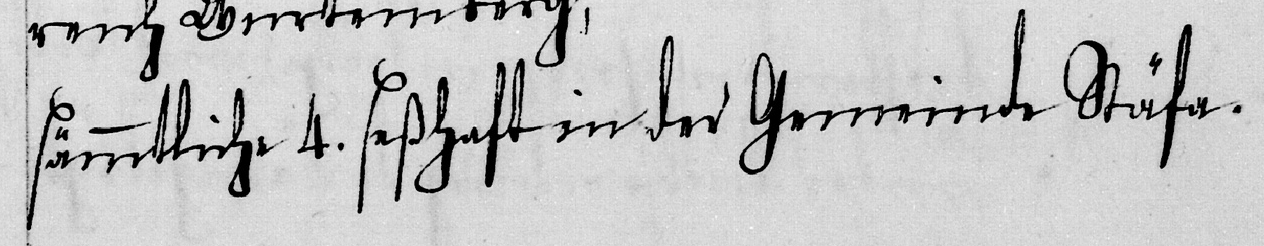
sämmtliche 4. seßhaft in der Gemeinde Stäfa.
